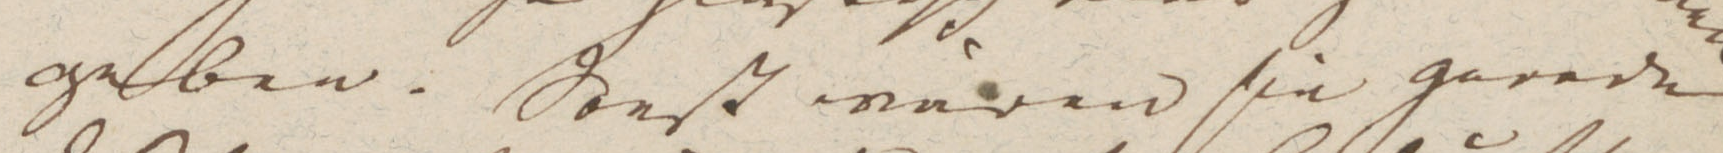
geben. Sonst wären sie gerade
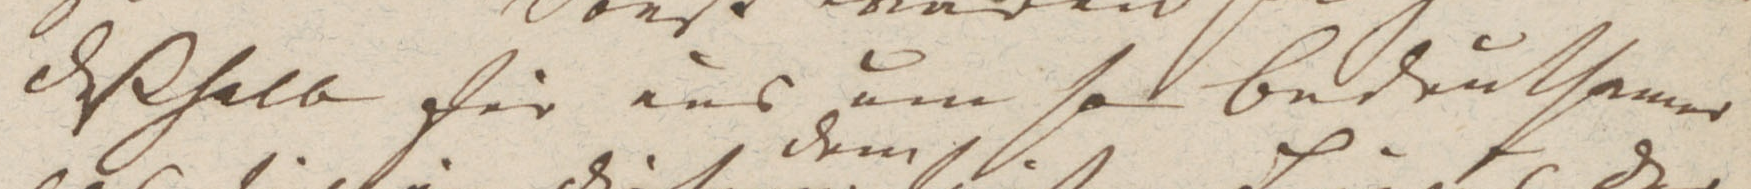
desshalb für uns um so bedeutsamer
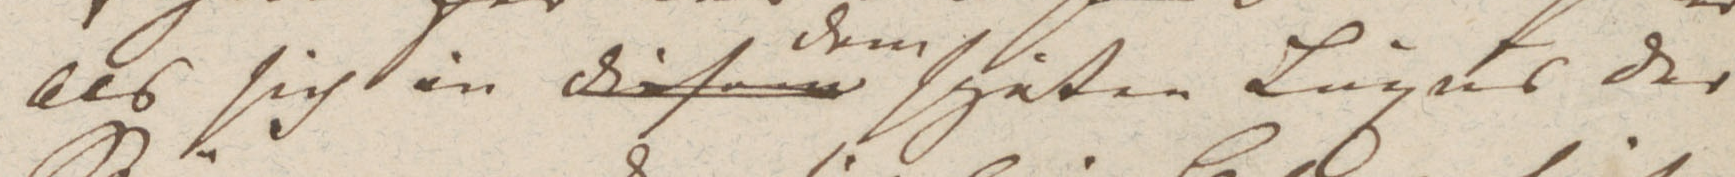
als sich in diesem dem späten Luxus der
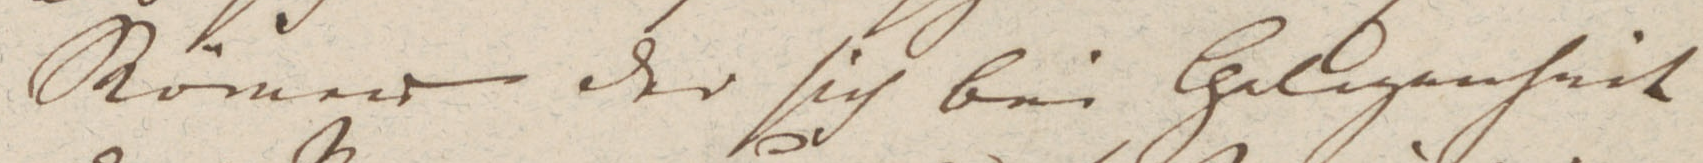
Römer der sich bei Gelegenheit
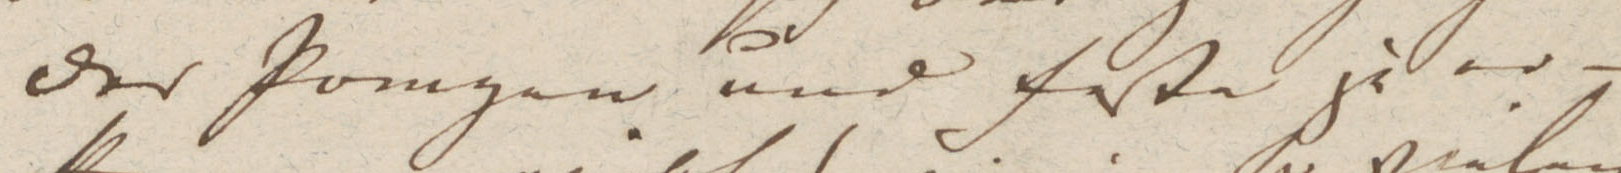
der Pompen und Feste zu er-
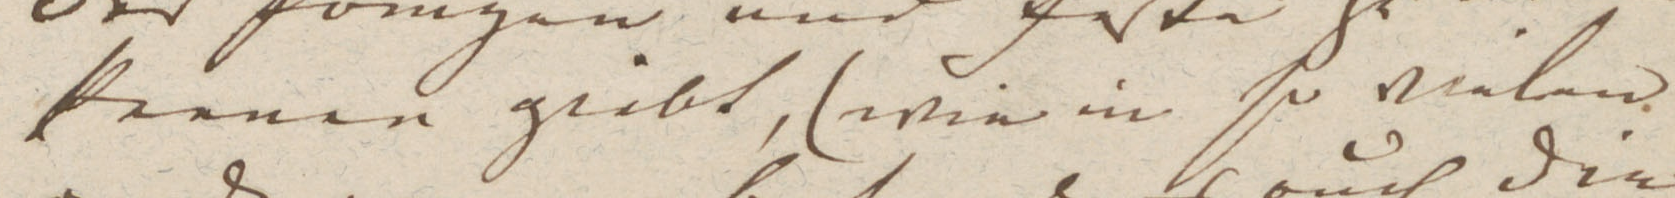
kennen giebt, (wie in so vielen
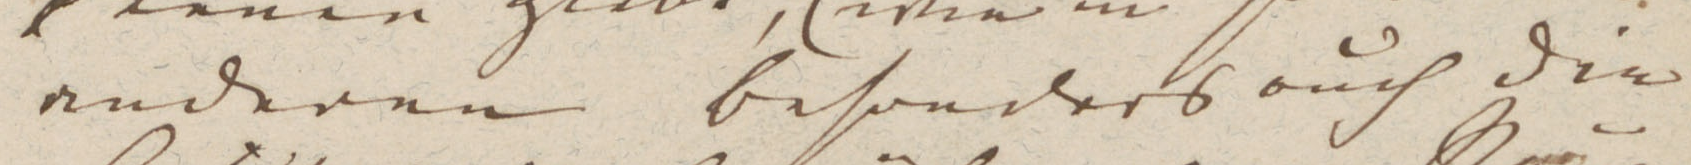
anderen besonders auch die
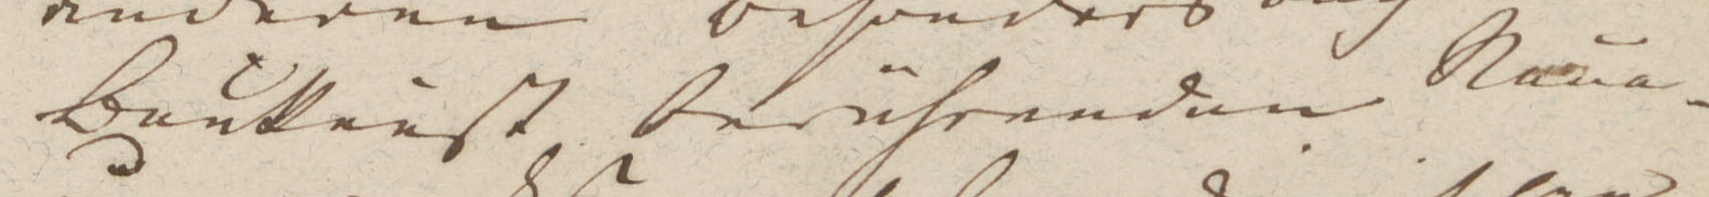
Baukunst berührenden Neue-
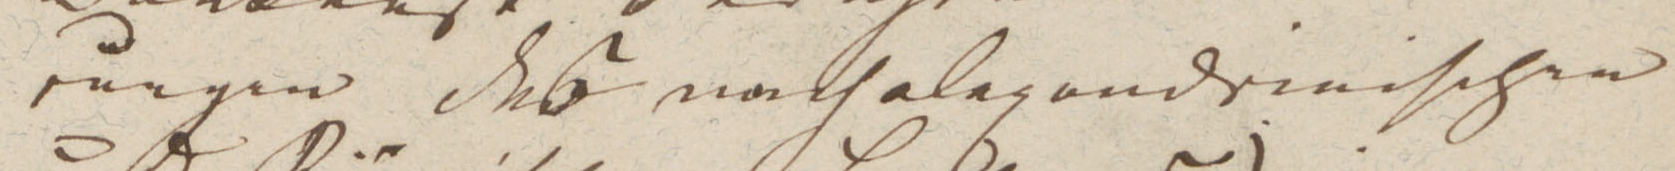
rungen ders nachalexandrinischen
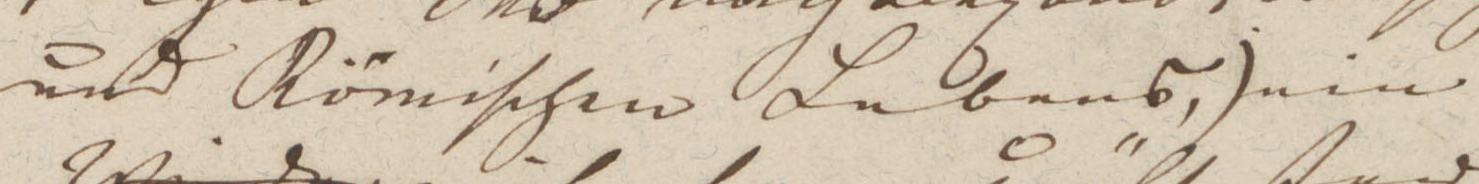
und Römischen Lebens,) ein
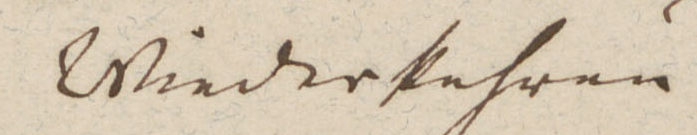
Wiederkehren
